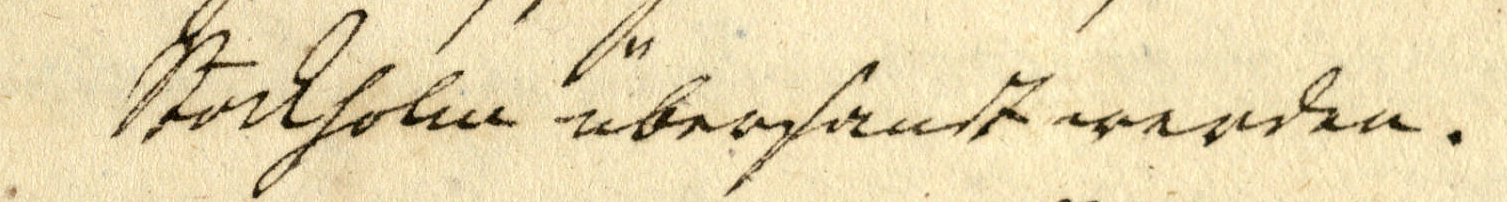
Stockholm übersandt werden.
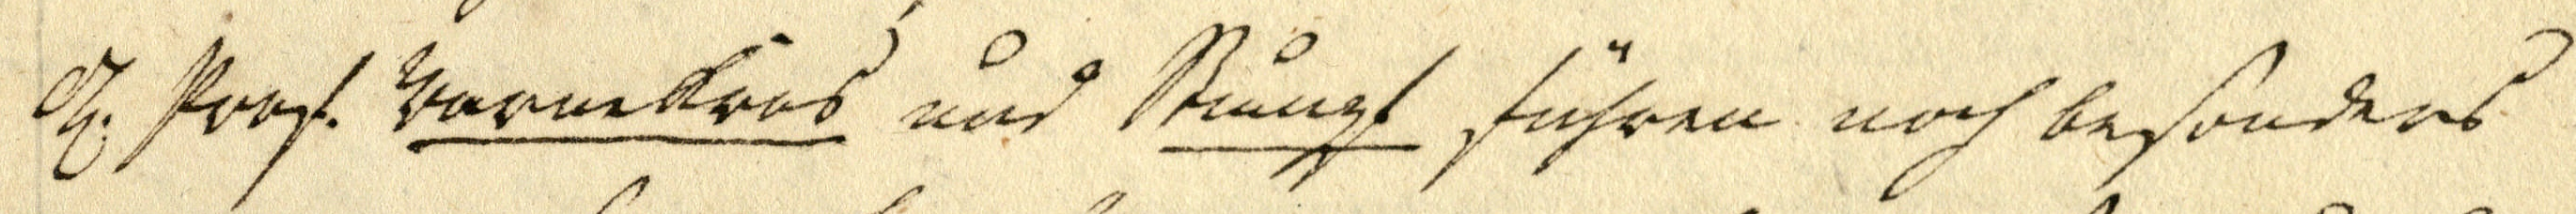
dh. Prof. Warnekros und Stumpf führen noch besonders
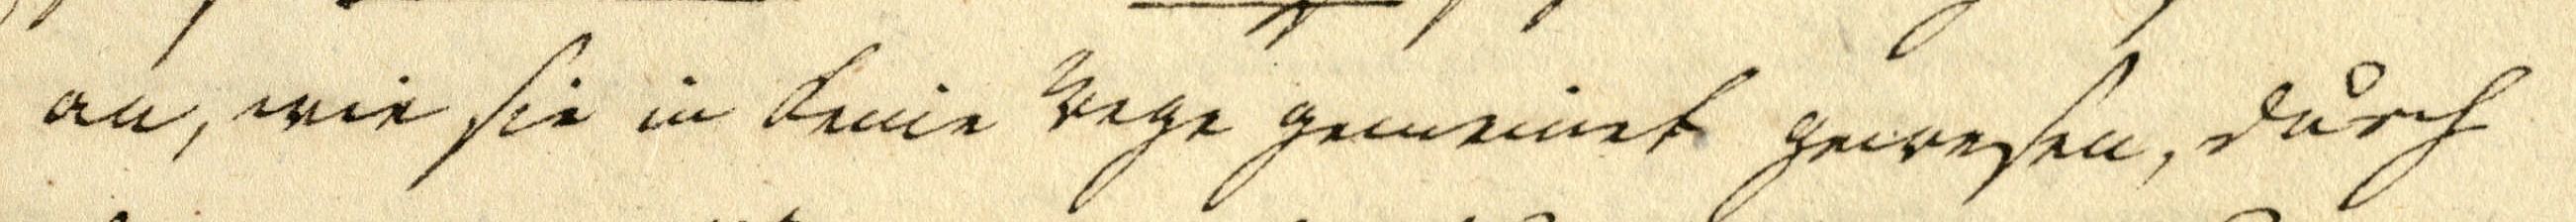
an, wie sie in keine Wege gemeinet gewesen, durch
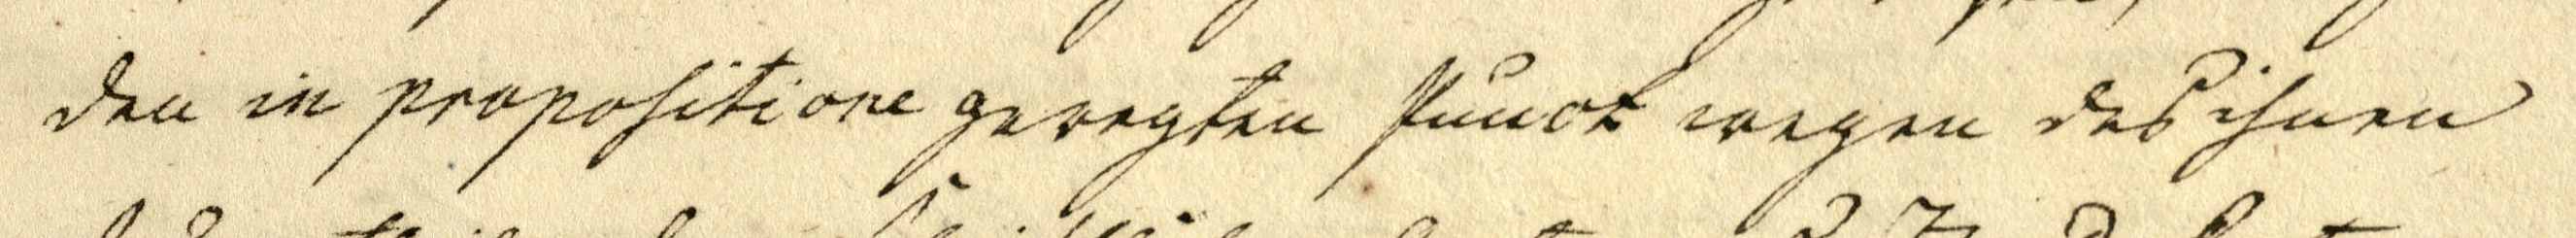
den in propositione geregten Punct wegen des ihnen
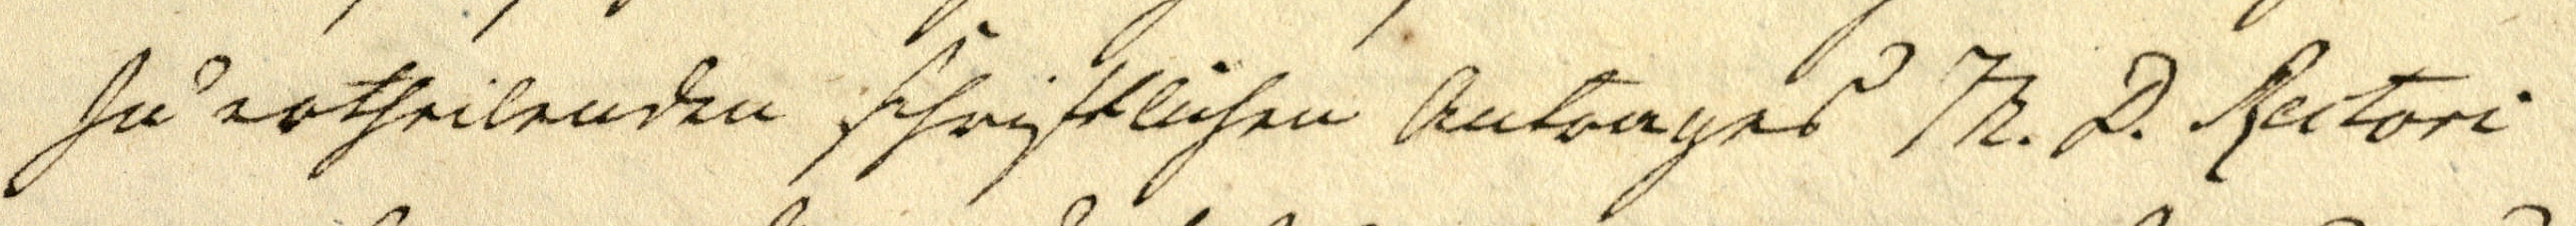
zu ertheilenden schriftlichen Antrages M. D. Rectori
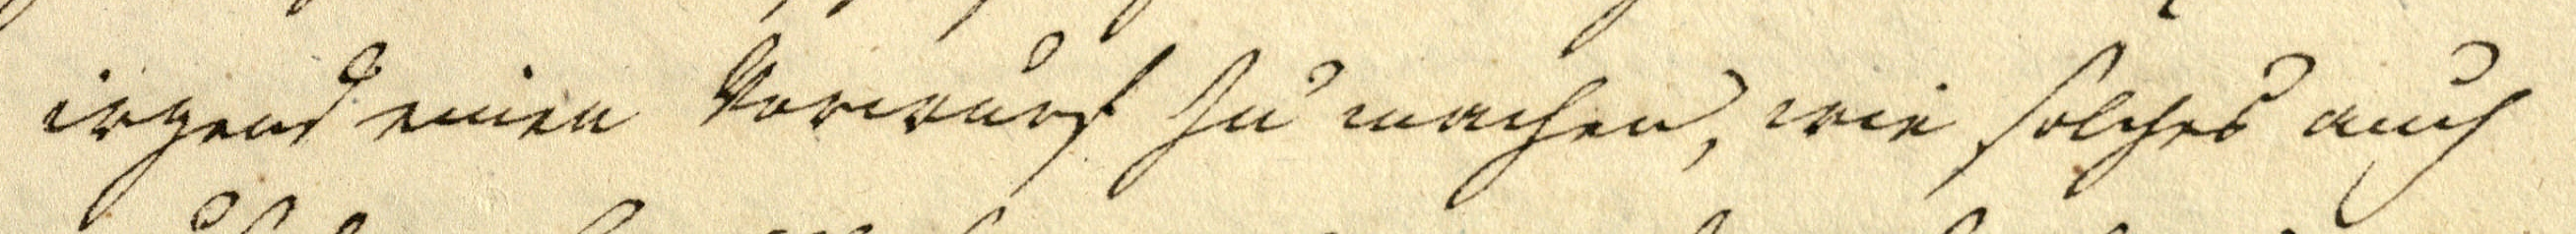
irgend einen Vorwurf zu machen, wie solches auch
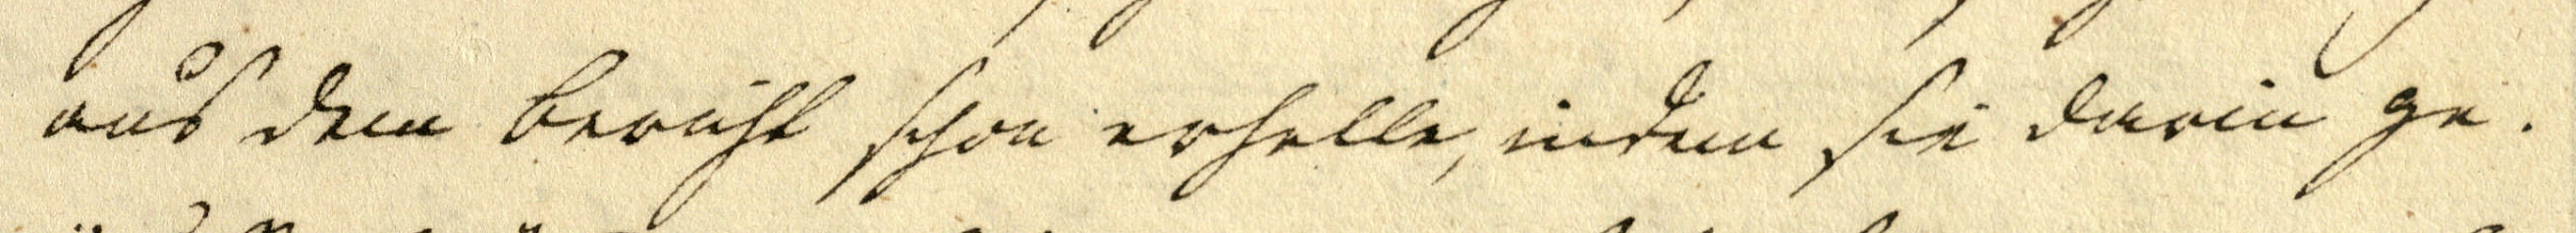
aus dem Bericht schon erhelle, indem sie darin ge¬
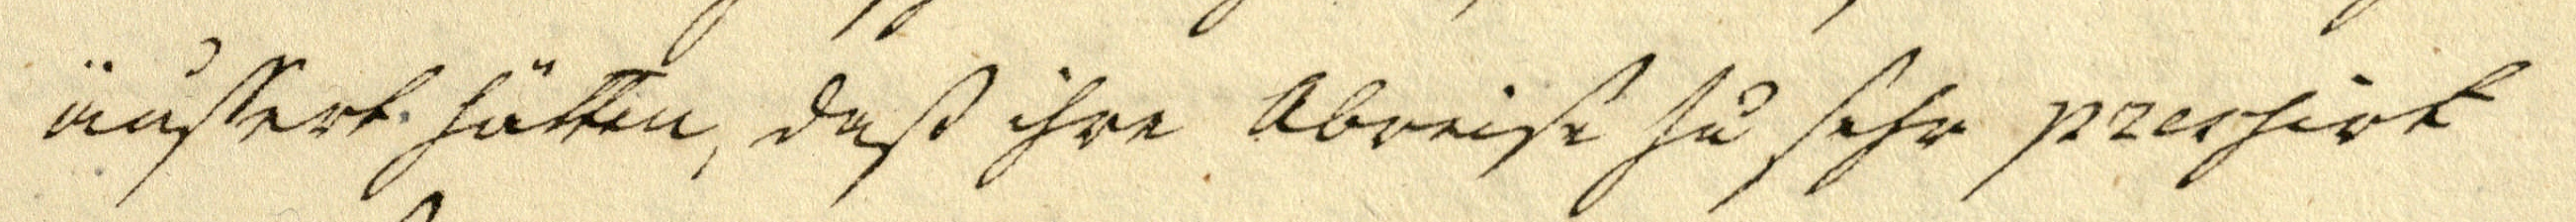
äussert hätten, daß ihre Abreise zu sehr pressirt
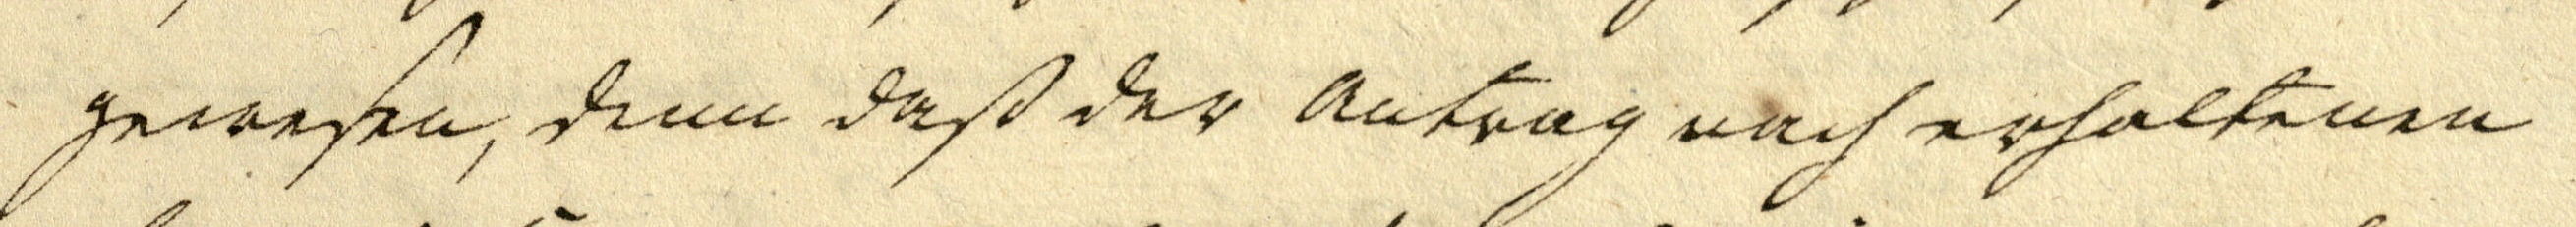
gewesen, denn daß der Antrag nach erhaltenen
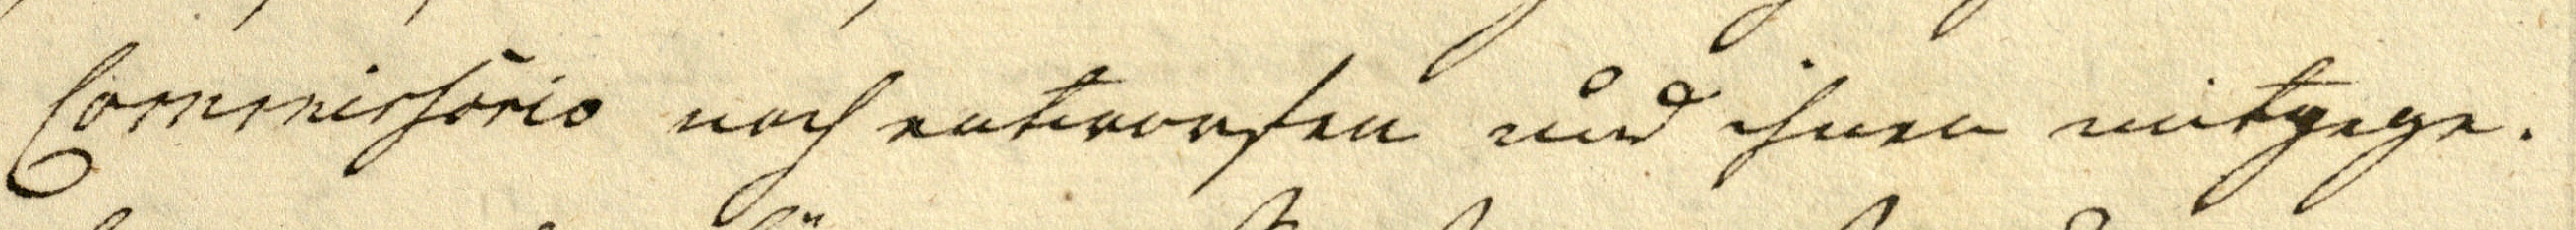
Commissorio noch entworfen und ihnen mitgege¬
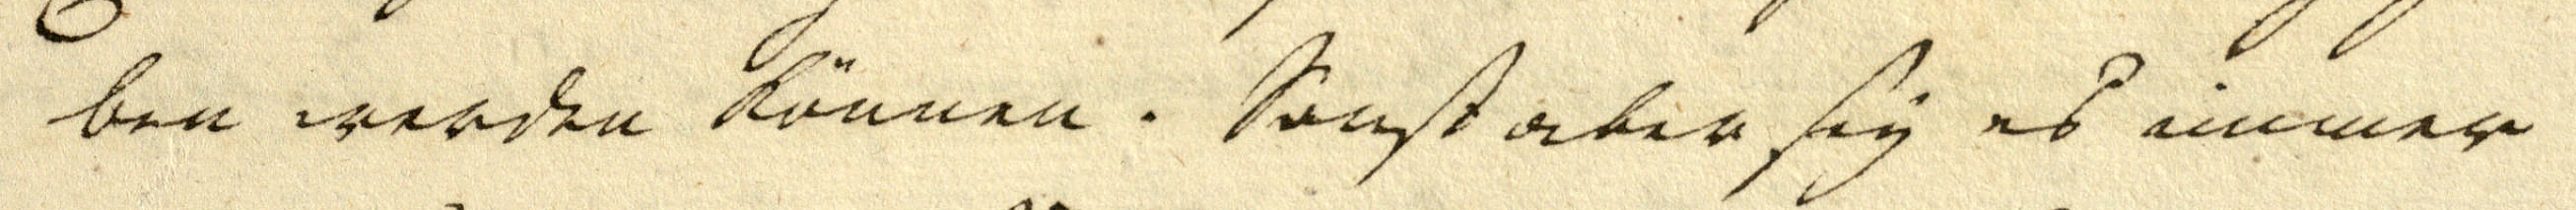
ben werden können. Sonst aber seÿ es immer
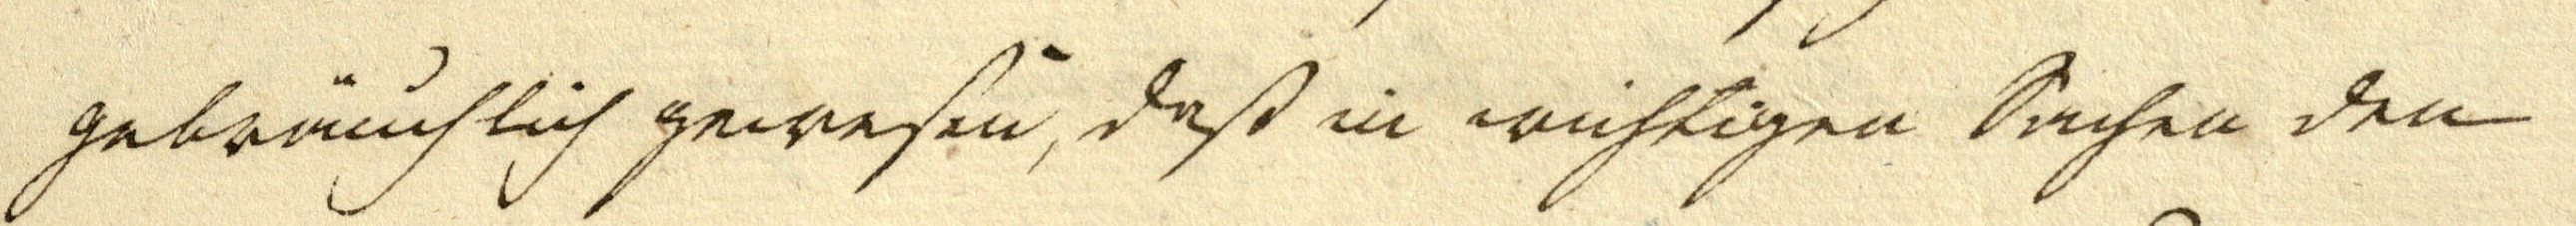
gebräuchlich gewesen, daß in wichtigen Sachen den
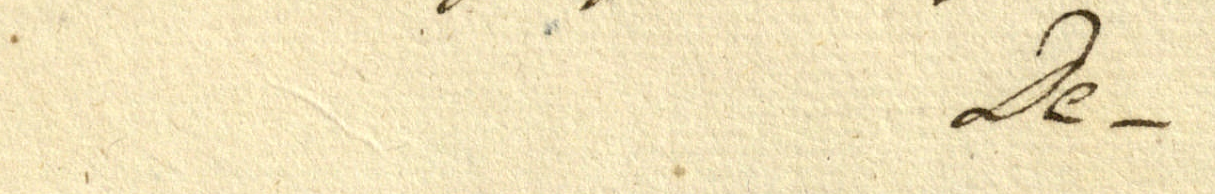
De
